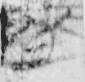陵
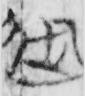○（卜）
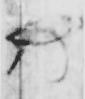尹
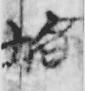塙
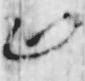㠯（以）
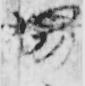楊
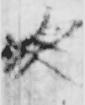虎
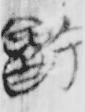斂
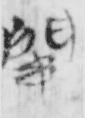○（關）
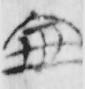金
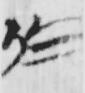於
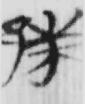邾
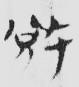敓
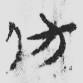仿
